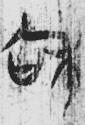和
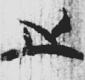之
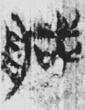○（莊）
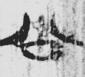公
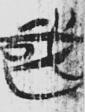或（又）
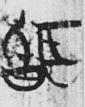䎽（問）
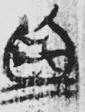爲
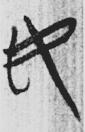女（如）
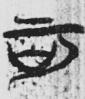可（何）
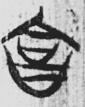合
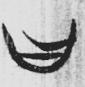曰
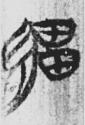○（申）
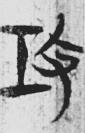攻（功）
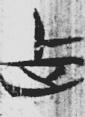上B（上）
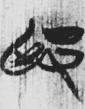○（賢）
